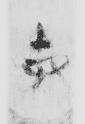{十四}
